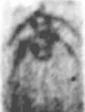高
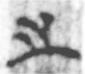之
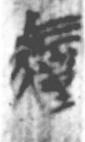騜
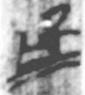爲
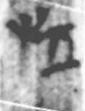○（左）
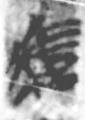驂
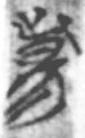○（陽）
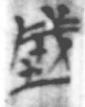城
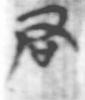君
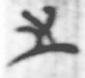之
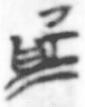爲
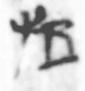○（左）
